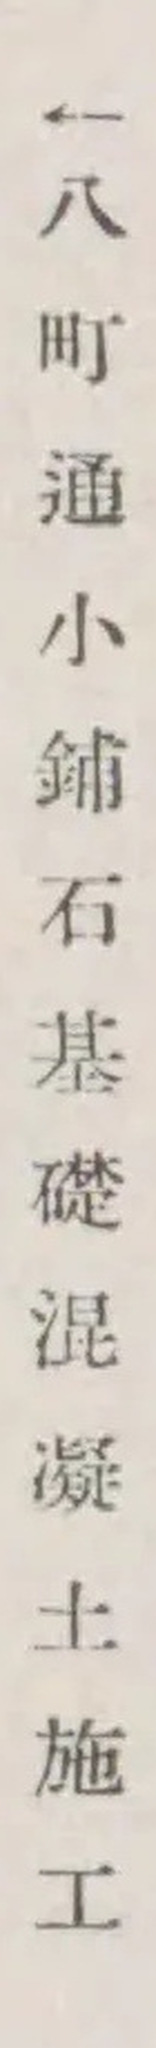↓八町通り小鋪石基礎混凝土施工

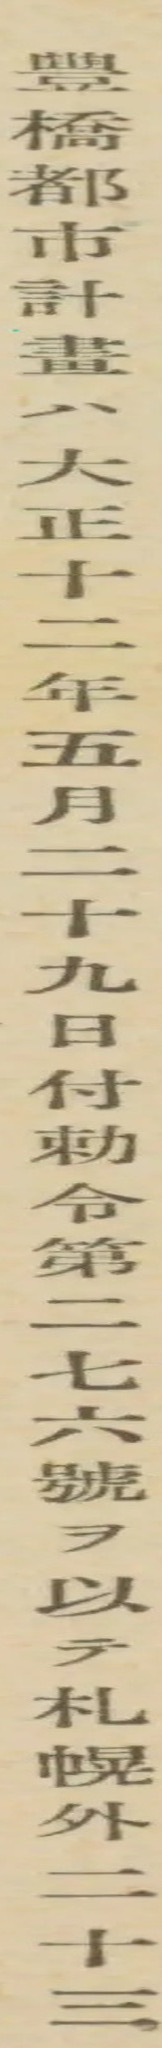豊橋都市計画ハ大正十二年五月二十九日付勅令第二七六号ヲ以テ札幌外２二十三
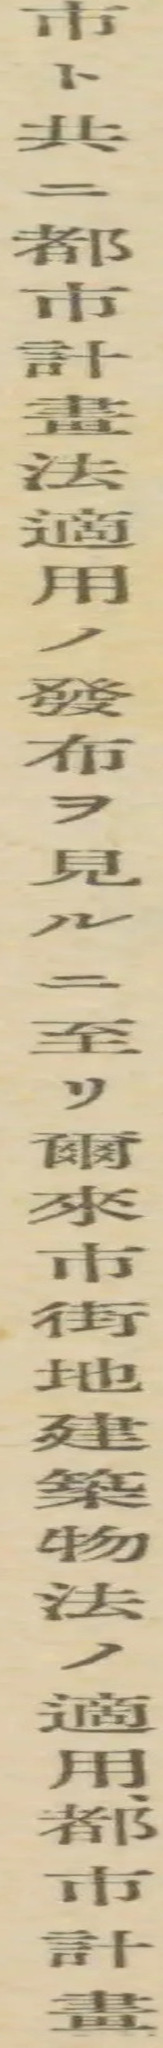市ト共ニ都市計画法適用ノ発布ヲ見ルニ至リ爾来市街地建築物法ノ適用都市計画
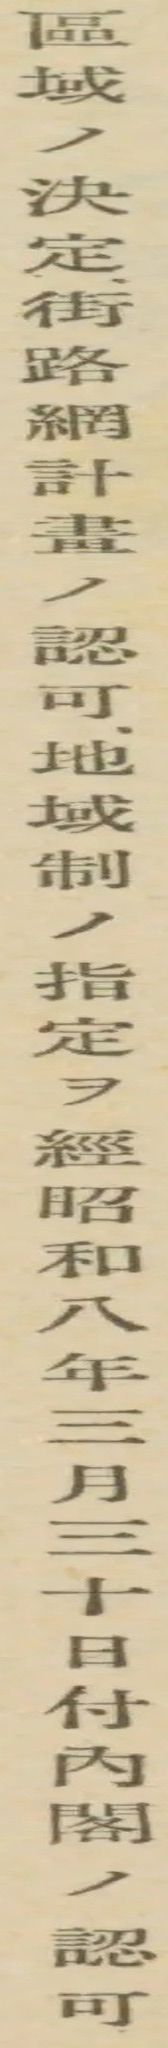区域ノ決定街路網計画ノ認可地域制ノ指定ヲ経昭和八年三月三十日付内閣ノ認可
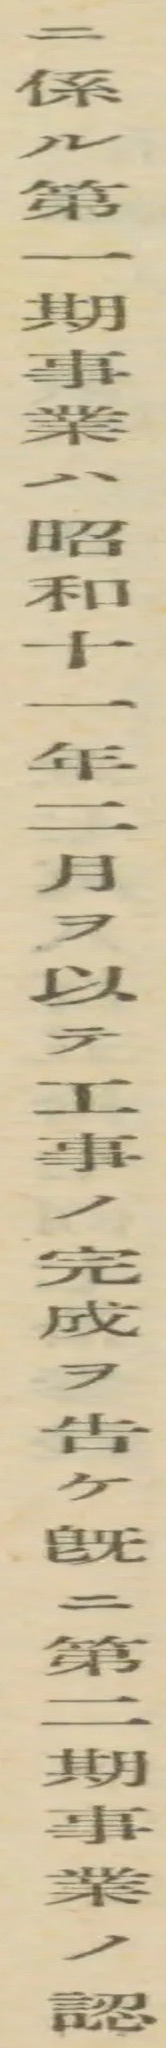ニ係ル第一期事業ハ昭和十一年二月ヲ以テ工事ノ完成ヲ告ケ既ニ第二期事業ノ認
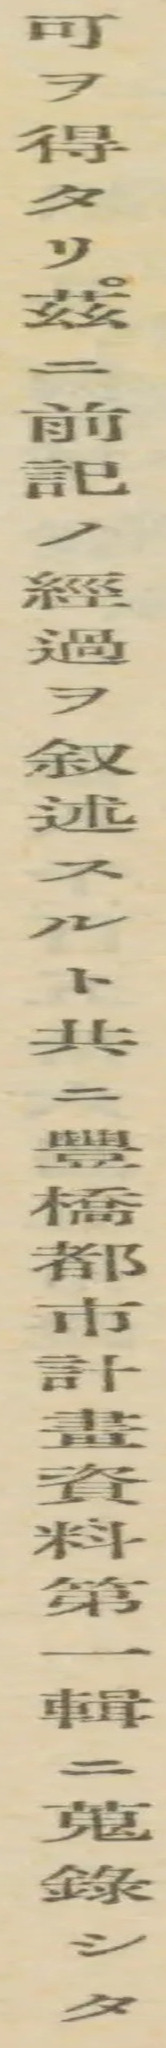可ヲ得タリ。茲ニ前期の経過ヲ叙述スルト共ニ豊橋都市計画資料第一輯ニ蒐録シタ
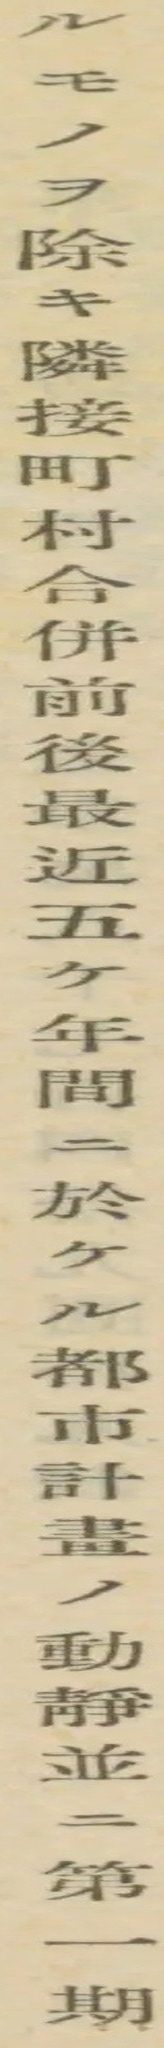ルモノヲ除キ隣接町村合併前後最近五ヶ年間ニ於ケル都市計画ノ動静並ニ第一期
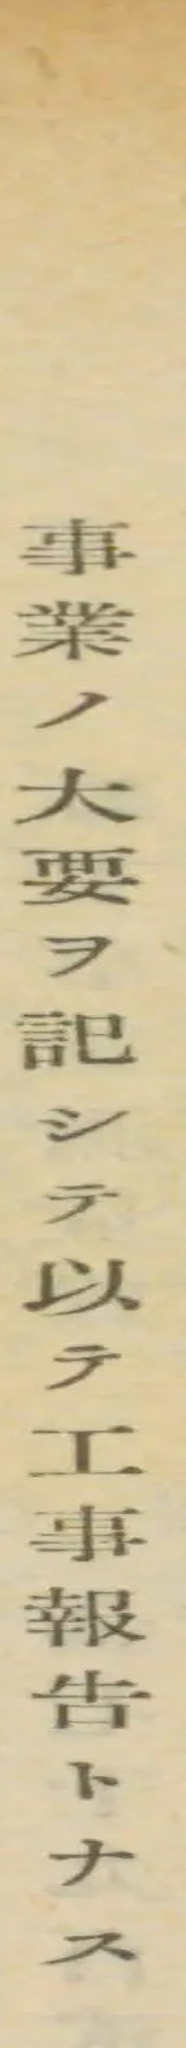事業ノ大要ヲ記シテ以テ工事報告トナス
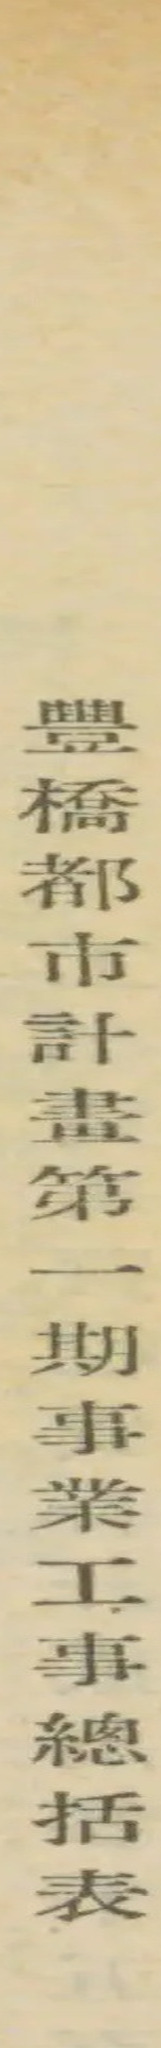豊橋都市計画第一期事業工事総括表
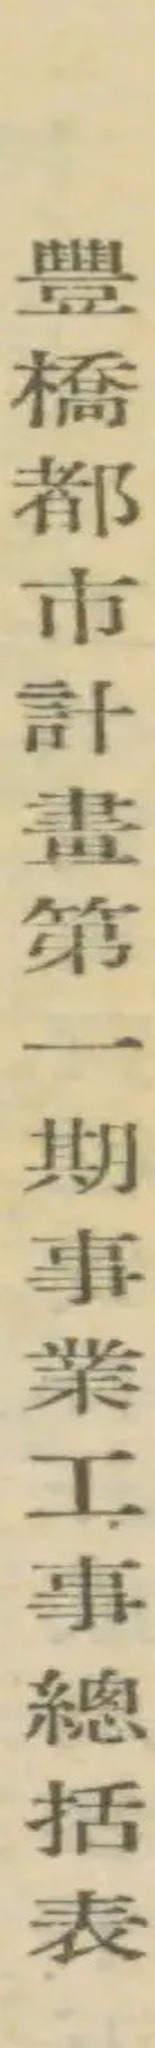豊橋都市計画第一期事業工事総括表
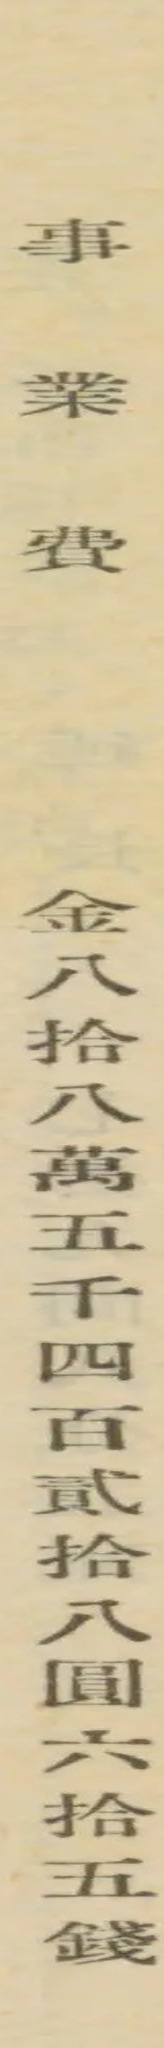事業長金八拾八万五千四百貮拾八円六拾五銭
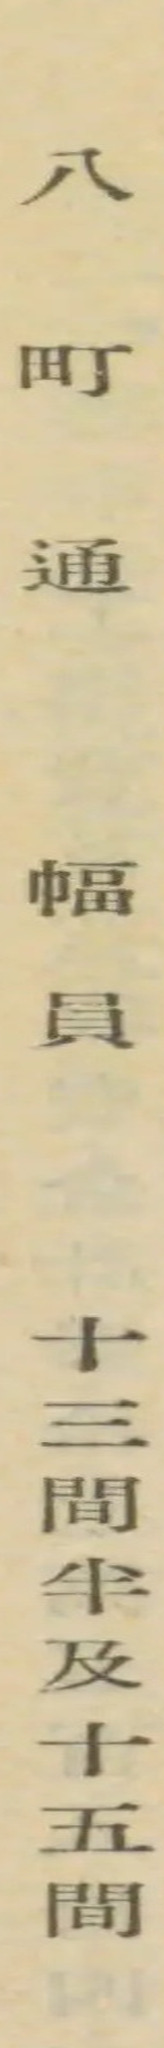八町通幅員十三間半及十五間
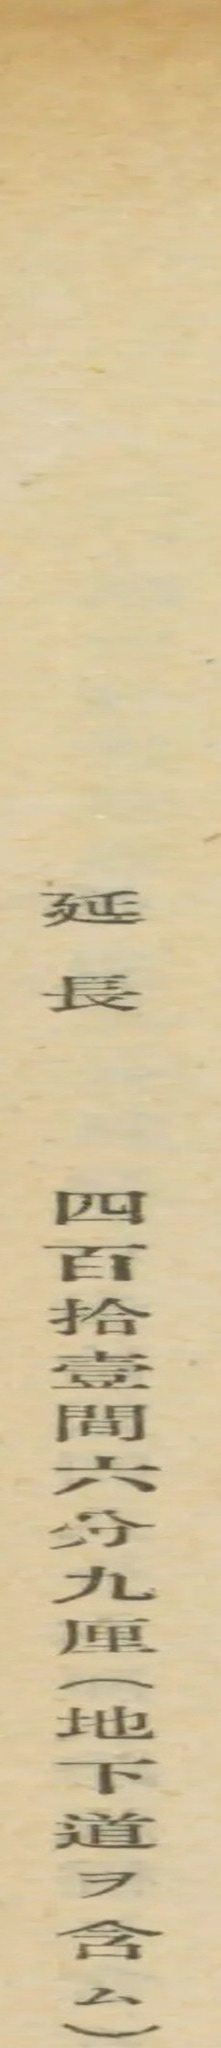延長四百拾壹間六分九厘(地下鉄ヲ含ム)
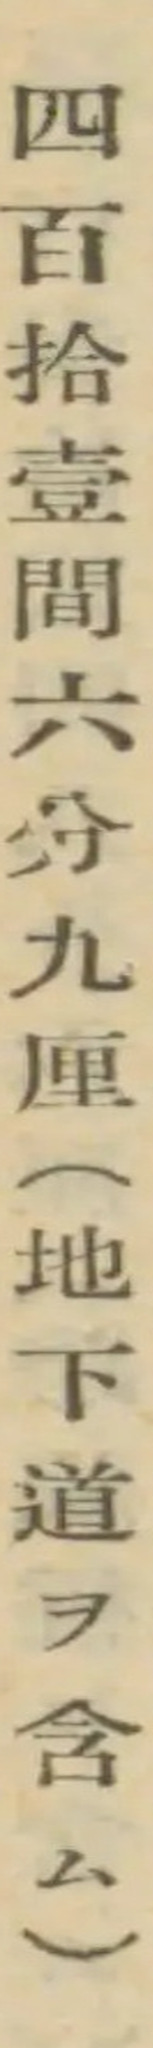延長四百拾壹間六分九厘(地下鉄ヲ含ム)
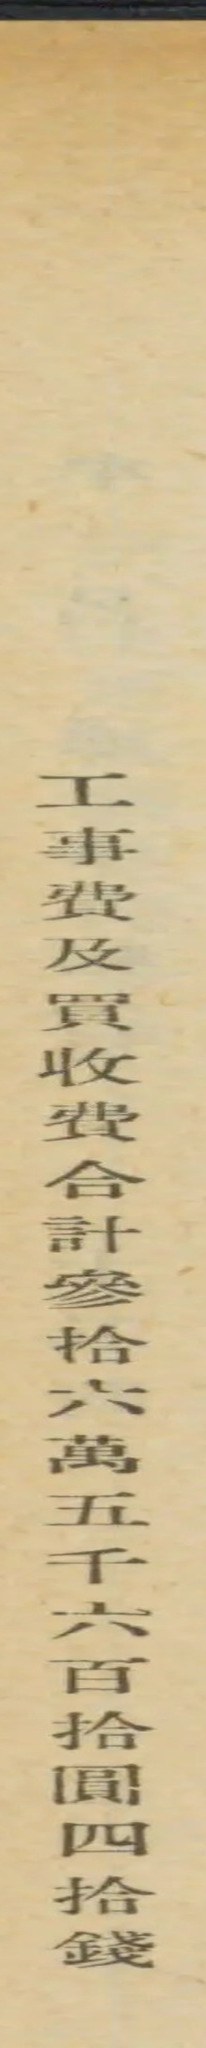工事費及買収費合計参拾六万五千六百拾円四拾銭

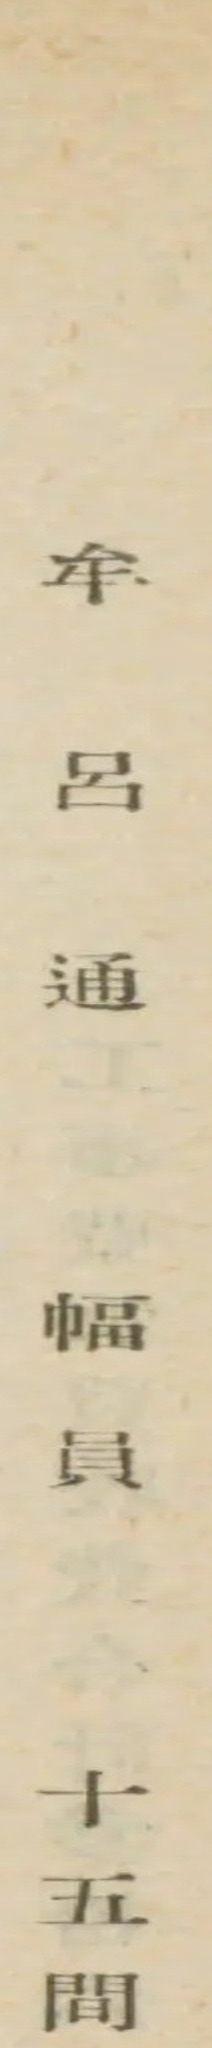牟呂通幅員十五間
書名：豊橋市都市計画第一期事業報告書
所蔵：国立国会図書館 National Diet Library, JAPAN
